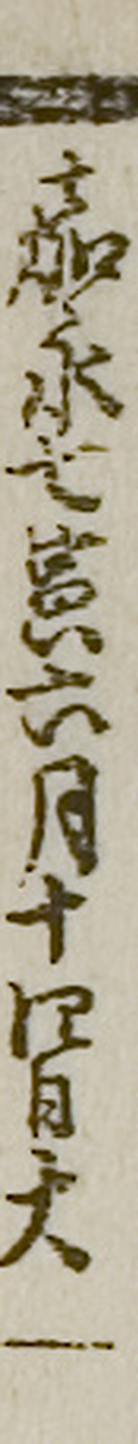嘉永七寅六月十四日大
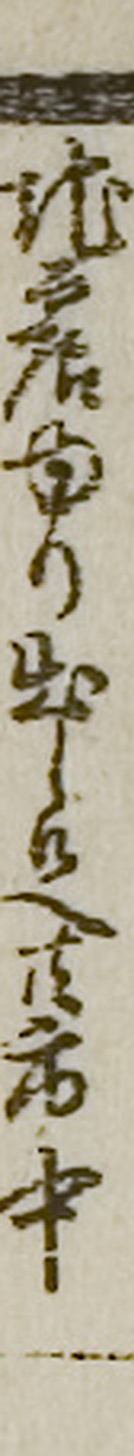地震ゆり出し候へ共市中
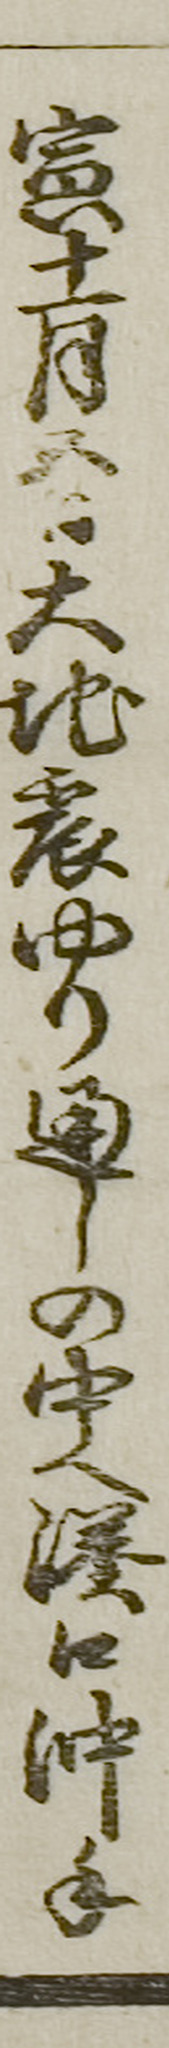寅十一月五日大地震ゆり通しの中へ湊口沖手
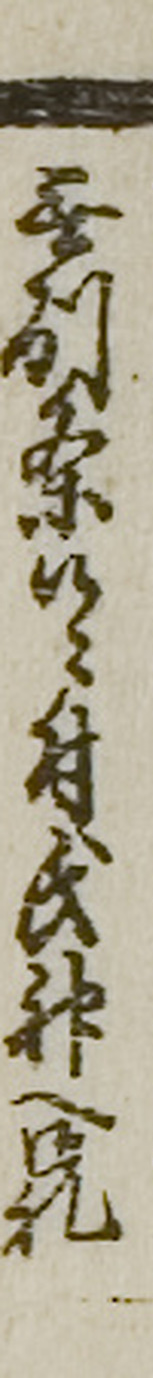無別条候に付氏神へ御礼
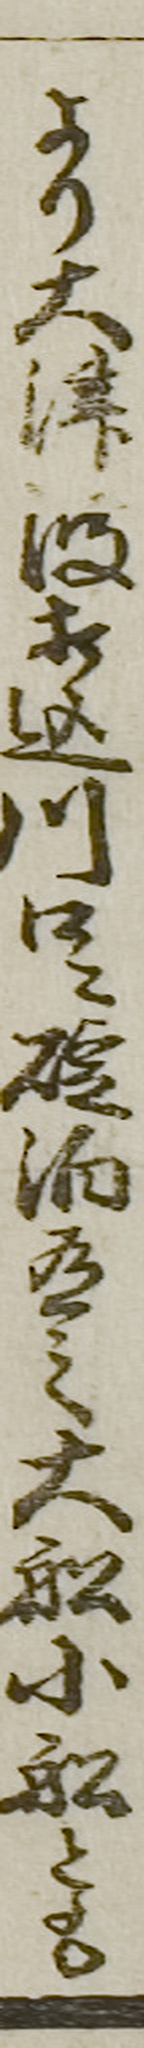より大津波打込川口に碇泊之大船小船とも
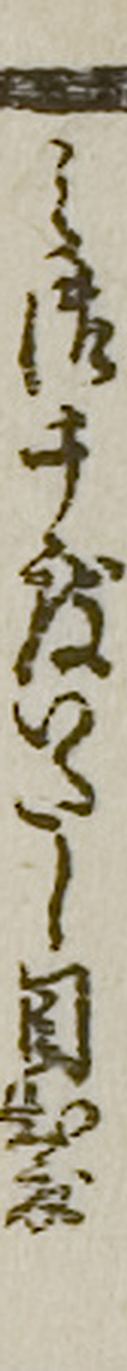の御千度いたし目出度
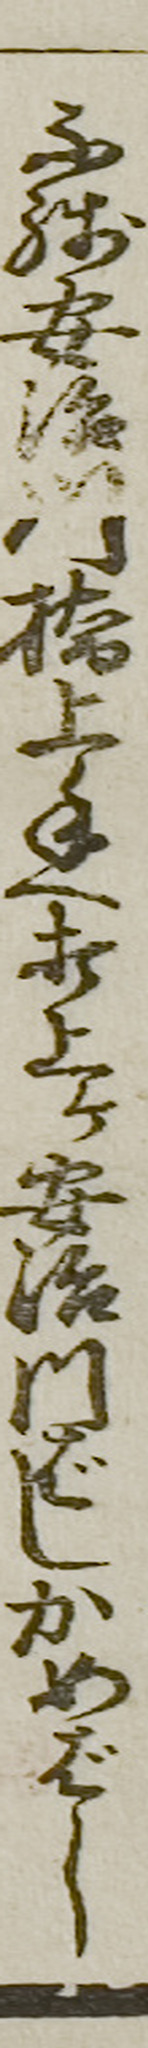不残安治川橋上手へ打上け安治川ばしかめばし
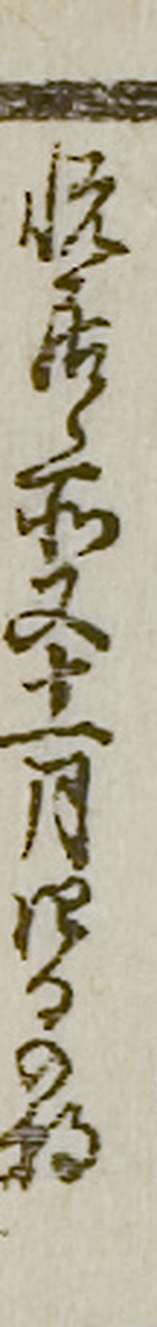悦居候所又十一月四日の朝
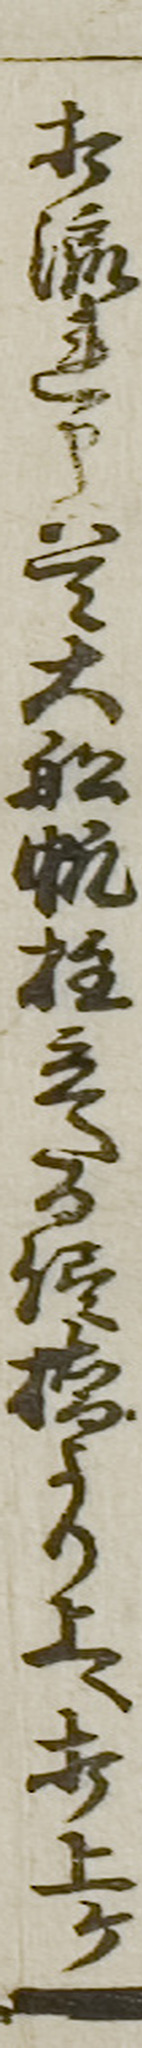打流れ申候て大船帆柱立たる侭橋より上へ打上け
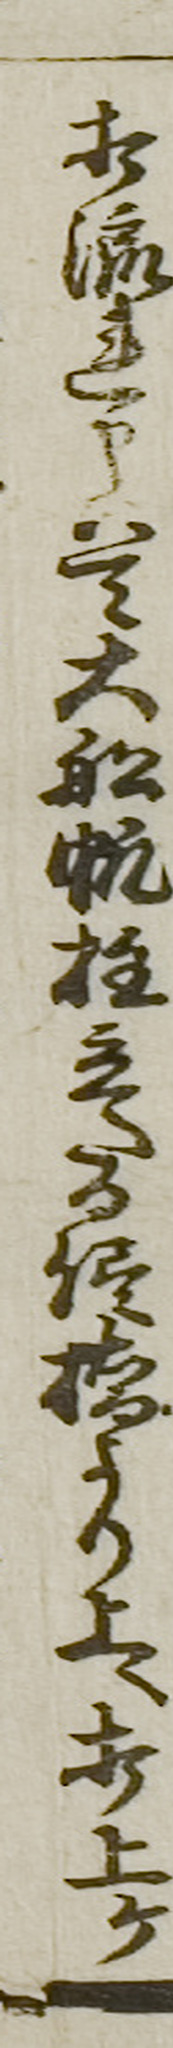打流れ申候て大船帆柱立たる侭橋より上へ打上け
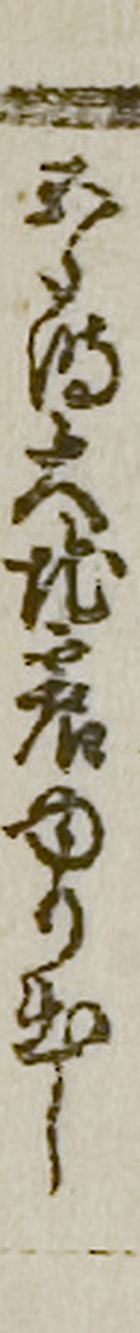五ッ時大地震ゆり出し
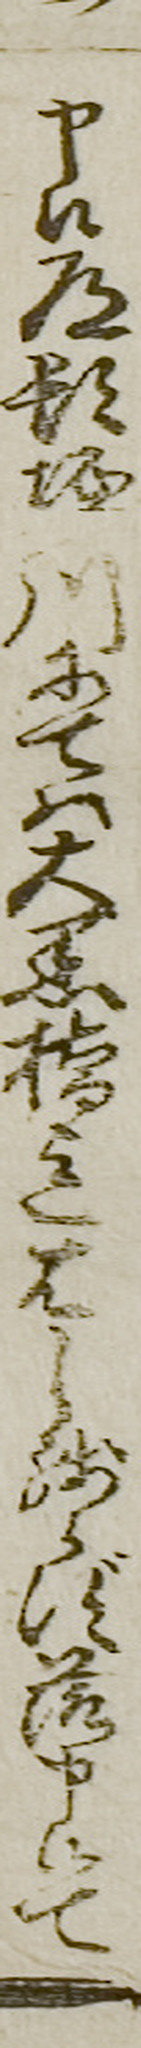申候道頓堀川にては大黒橋迄はし残らず落申候て
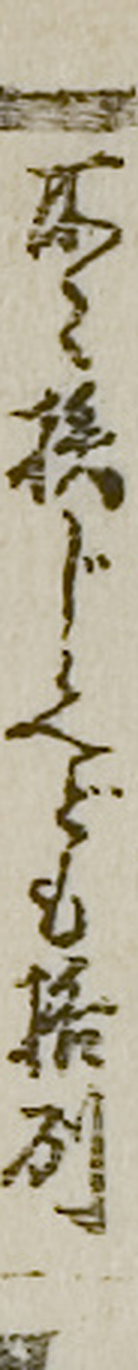所々損じ候へども格別
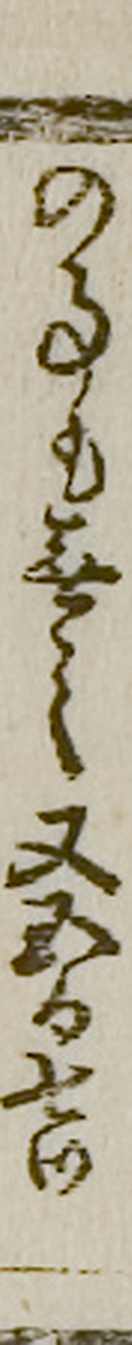の事も無之又五日七ッ
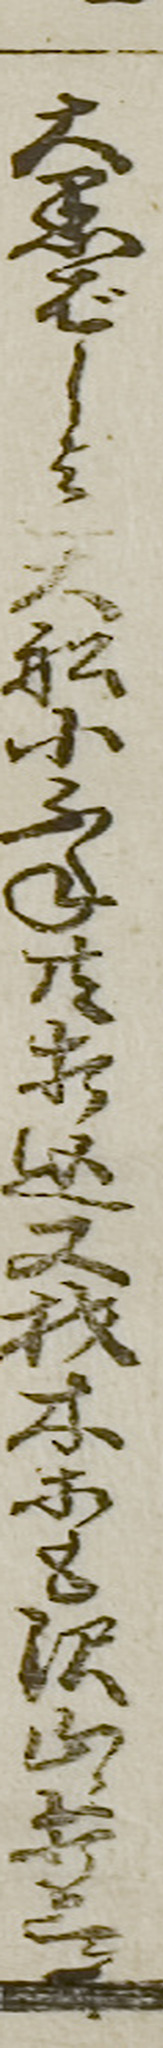大黒ばし迄大船小ふね共打込又材木等も沢山打上げ
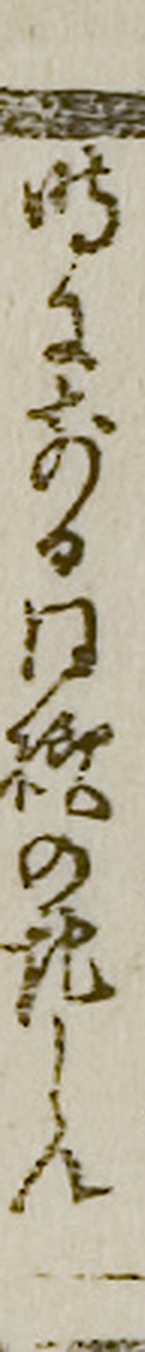時に前日同様の地しん
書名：東海道大阪辺大地震津波図
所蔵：東京大学総合図書館 General Library in the University of Tokyo, JAPAN
